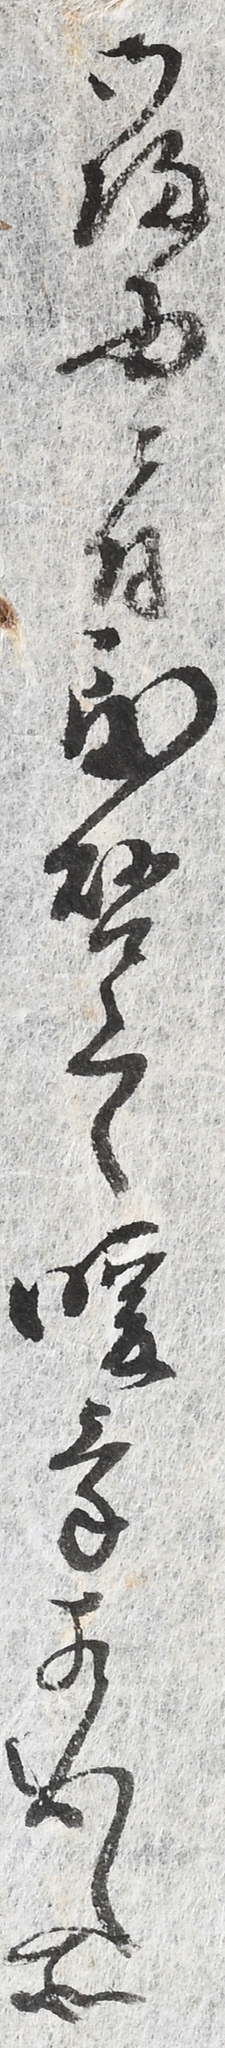御帰国ニ付致啓上候暖気相成候所
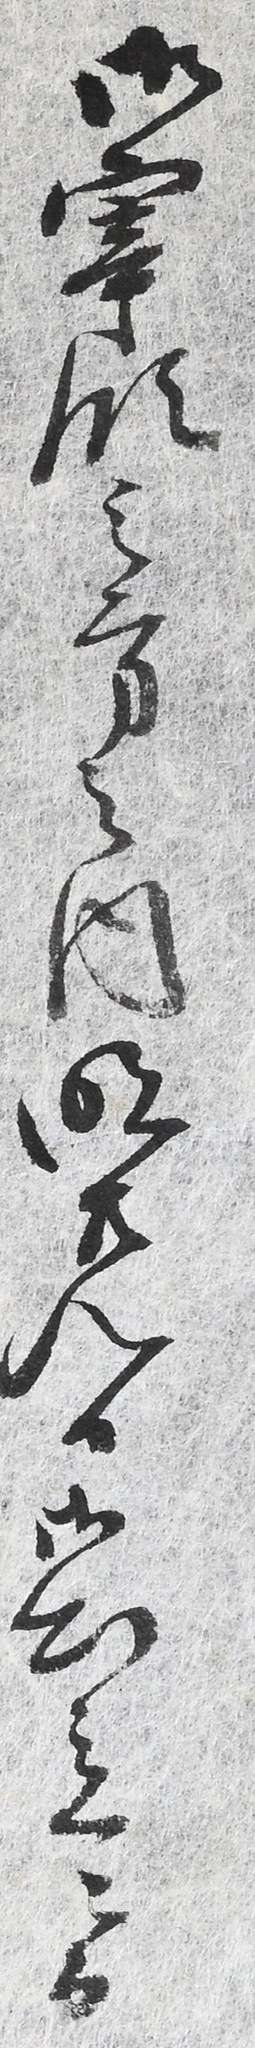御宰領之方之内明廿八日御出立ニ而
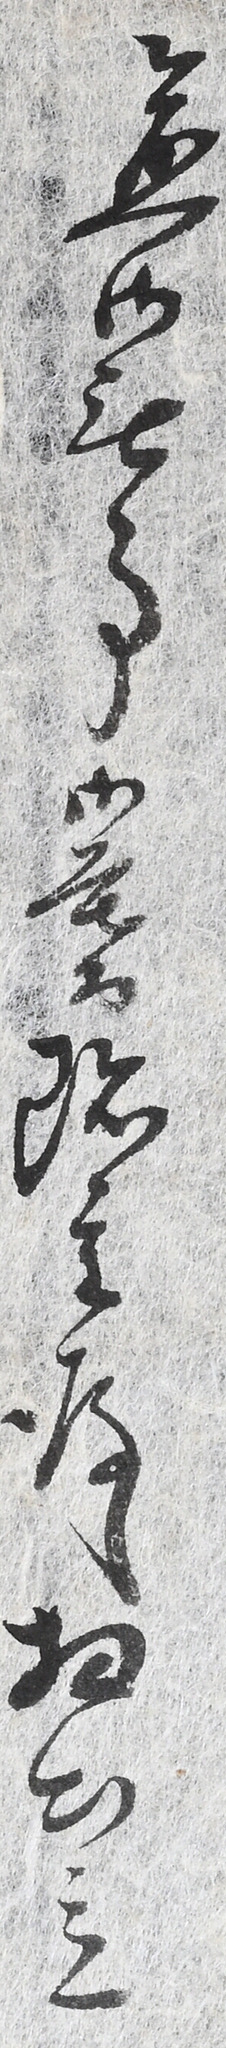愈御無事御暮珍重存候扨出立
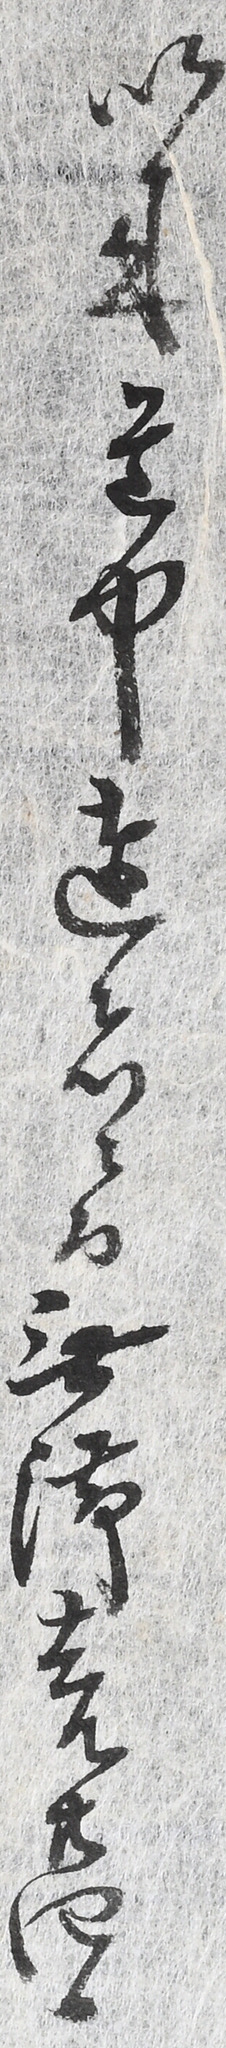以来道中達者ニ而無滞去ル廿四日
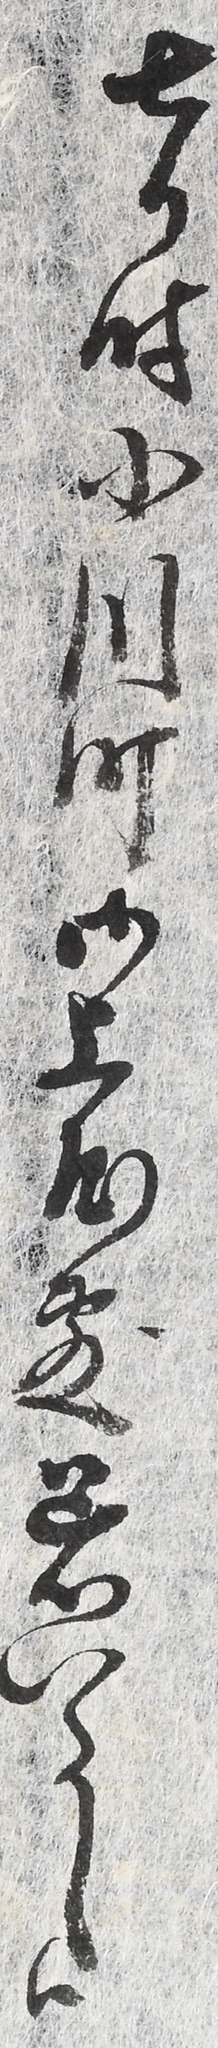七ツ時小川町御上屋敷着いたし候
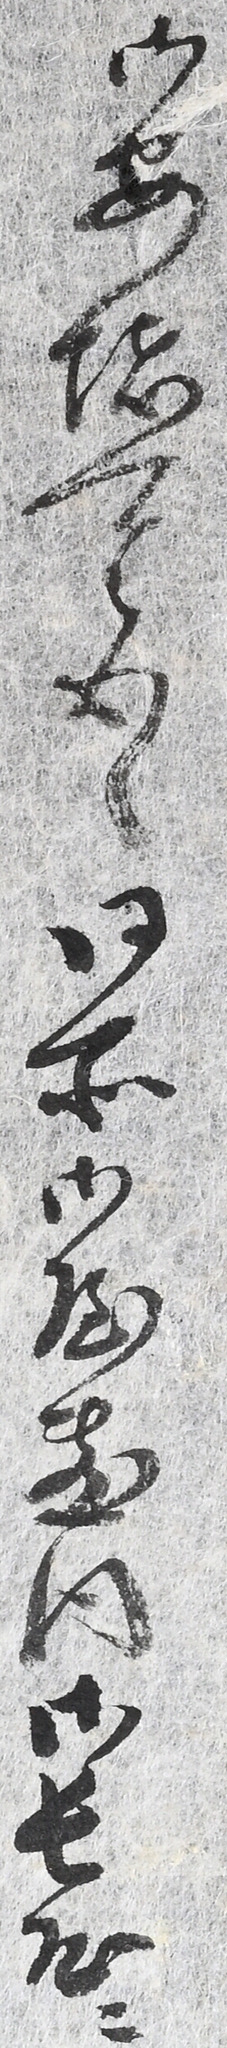御安堵可被成候同所御屋敷内御長屋ニ
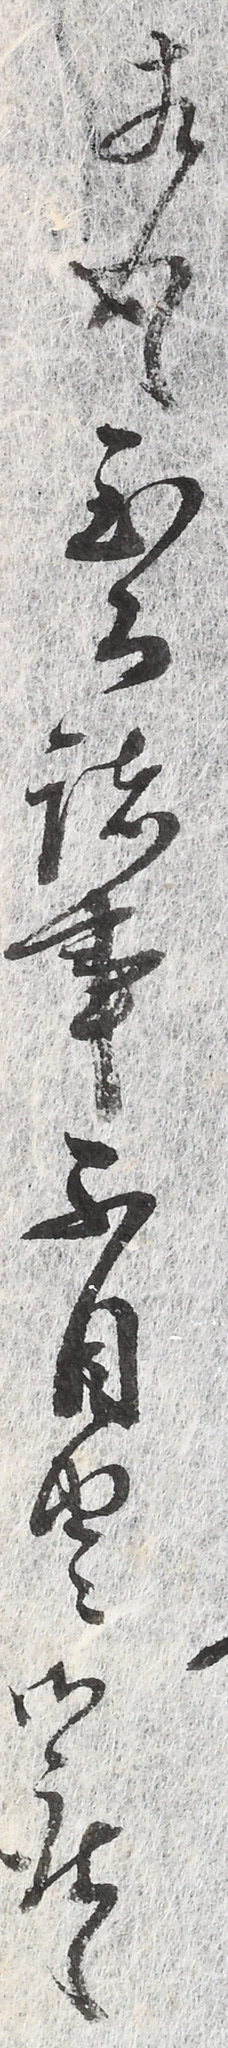相成候至而諸事不自由ニ御座候
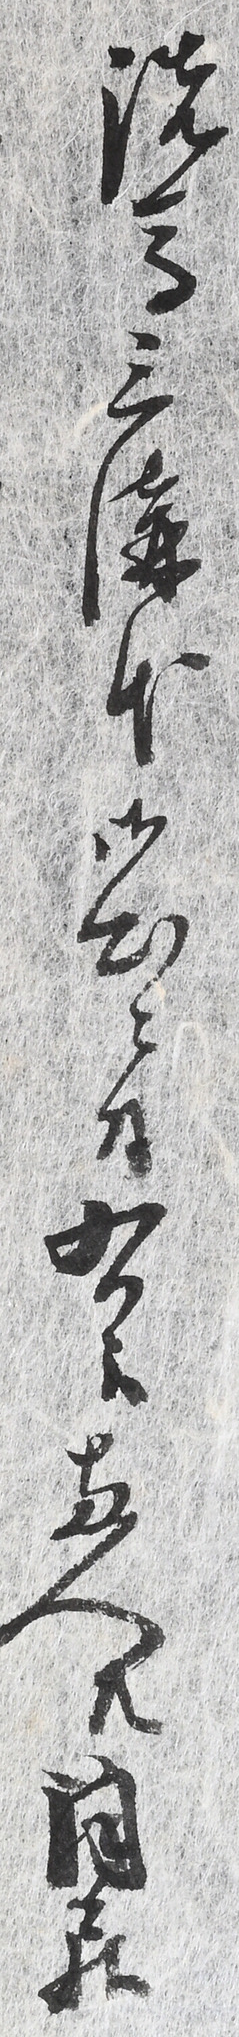洗馬三溝氏御出ニ付右江両人共同居
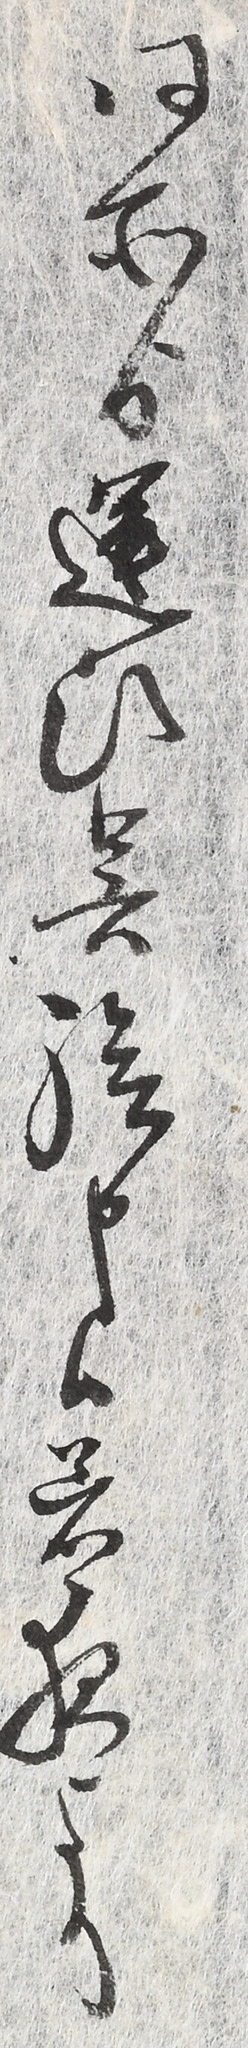同所ゟ運ひ呉給申候着夜より
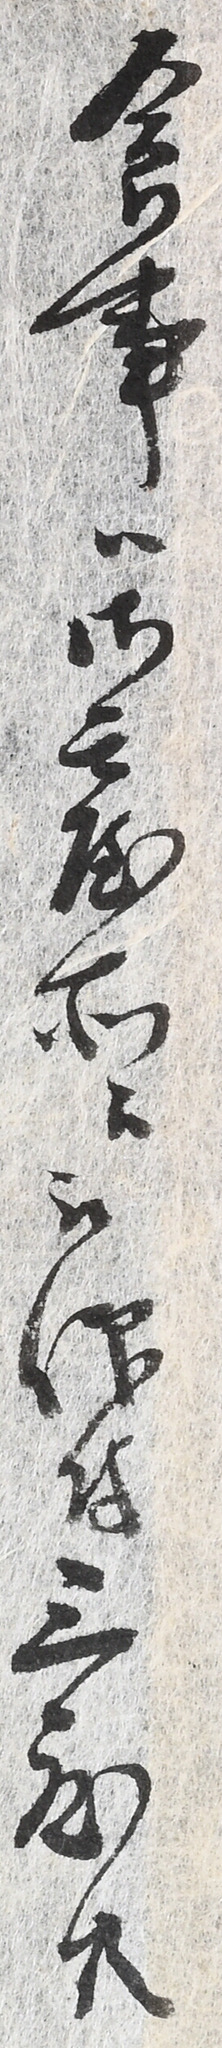食事ハ御臺所江被仰付三度共
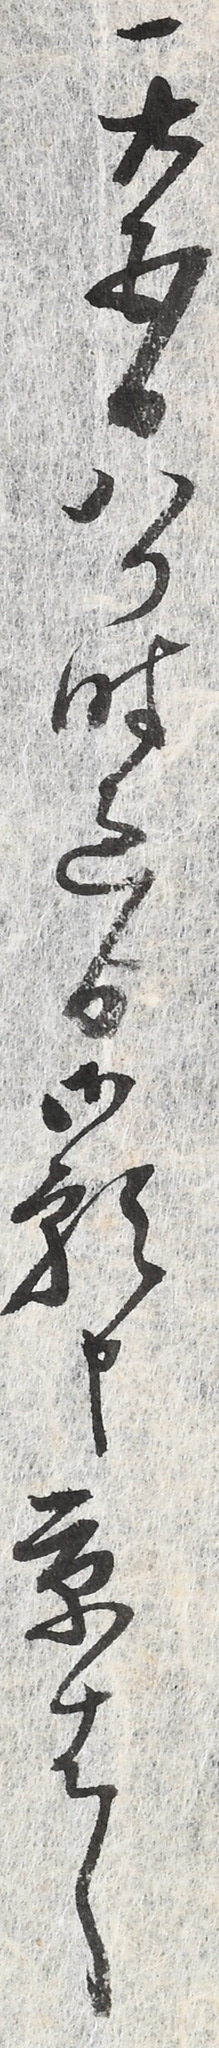一廿五日八ツ時過ゟ御願申京はし
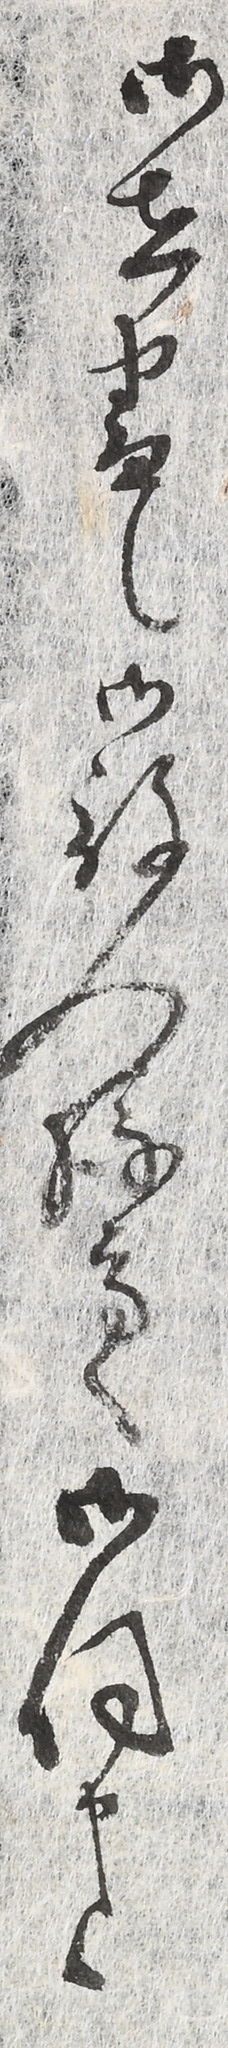御在番之御役人様方へ御伺申候
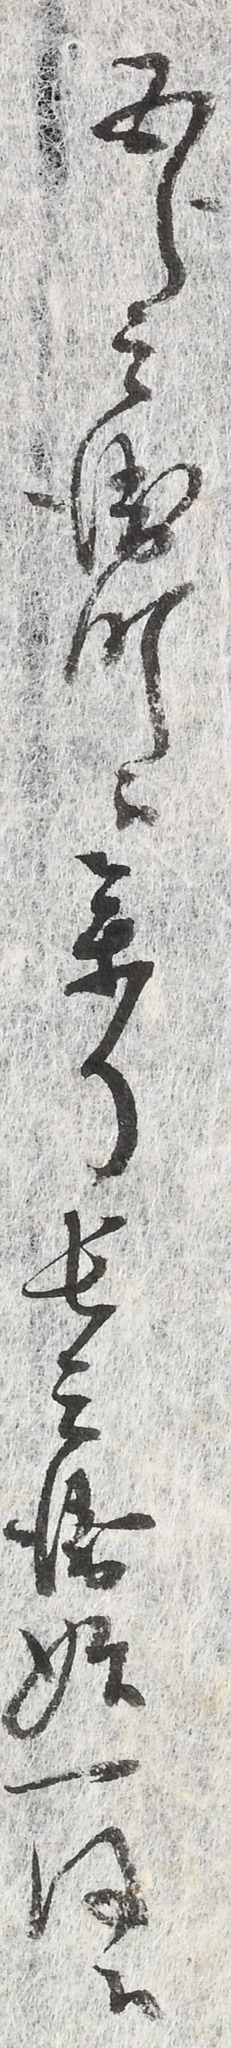五郎兵衛町江参り長兵衛始一同江
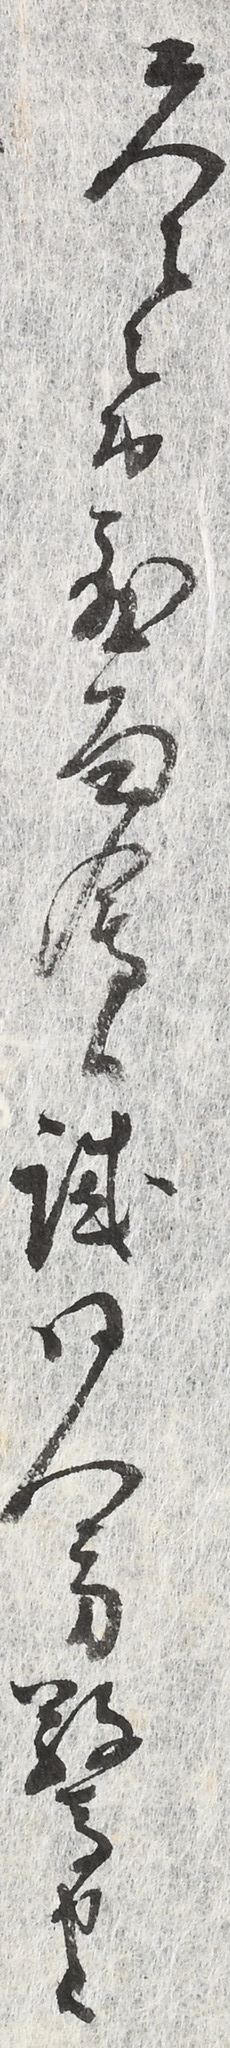夫々ニ而致面会候誠同人方驚申候
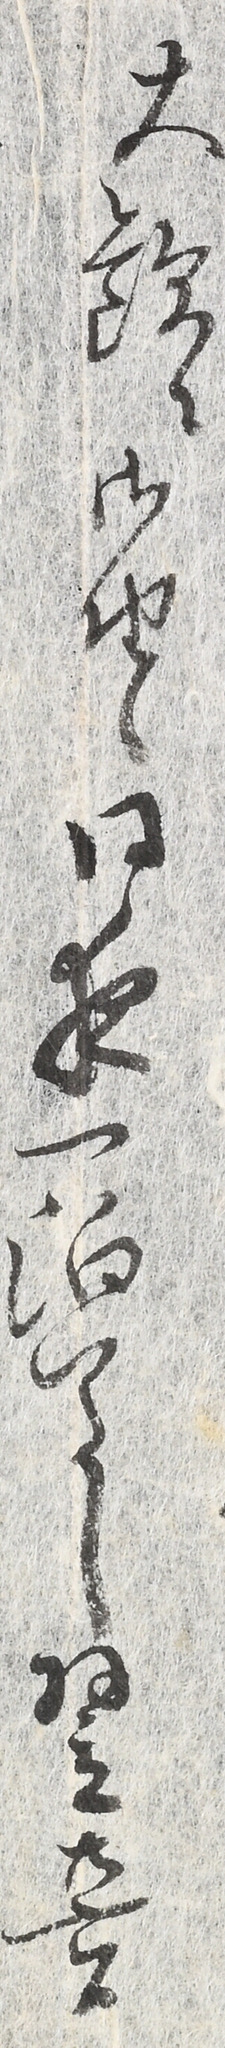大歓ニ御座候同夜一泊いたし翌廿六日
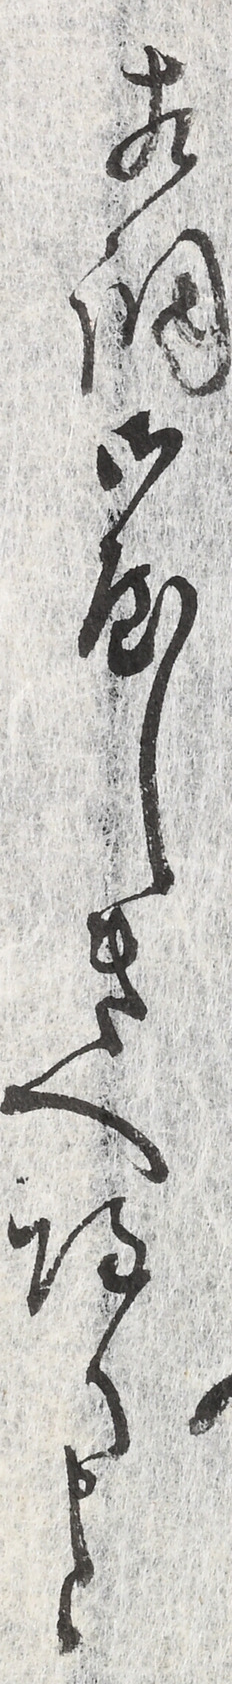相調御屋しきへ帰り申候
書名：（書状）
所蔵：伊那市立高遠町図書館・合同会社AMANE
